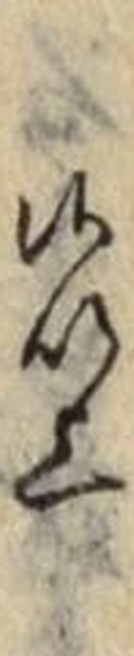候以上
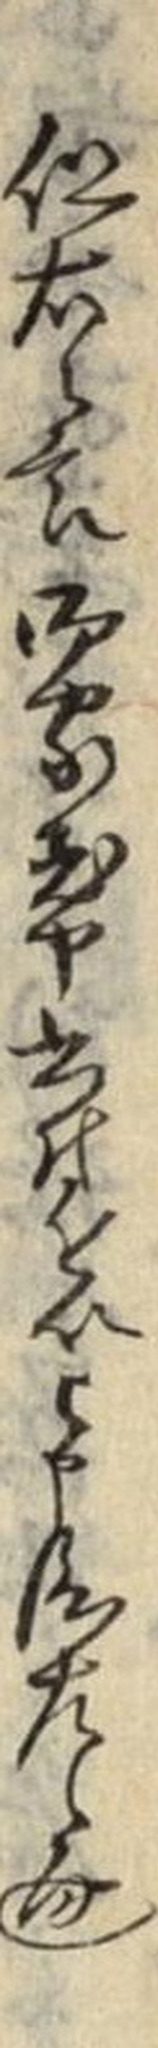但右之節御家老中書付を以被申渡左之通
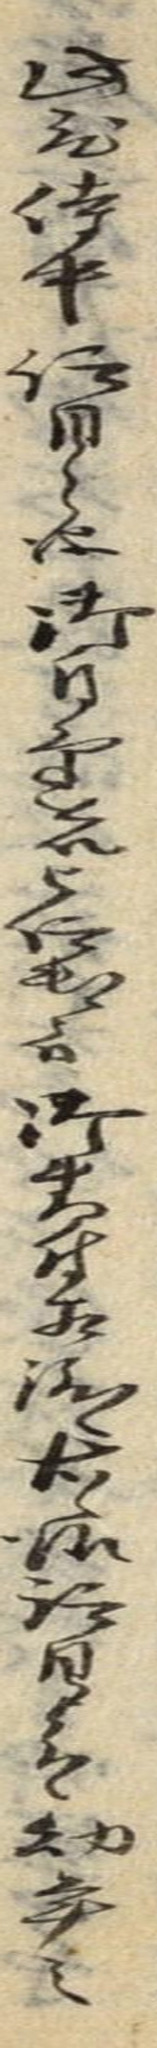此度侍中跡目之儀御自筆を以被仰出候に付御書付相渡候右之趣跡目被下候幼年之
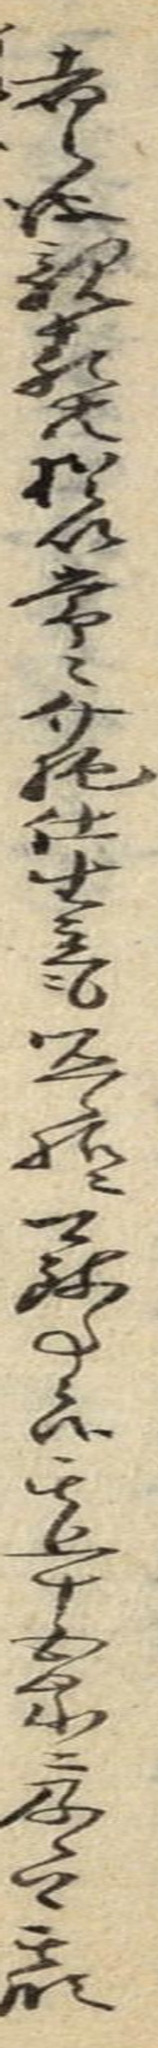者之儀親類共猶以常々介抱仕生立も宜候様に可致事に候其上十五歳に及候はゝ其段
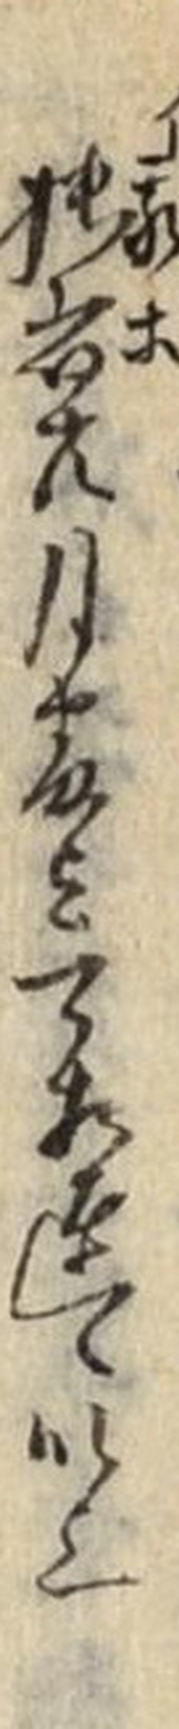拙者共月番迄可相達候以上
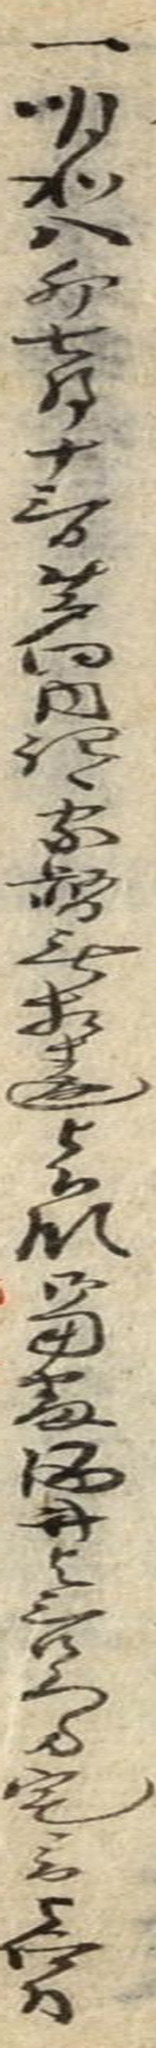一明和八卯七月十三日芦田内記へ家督無相違被下段御用番酒井与三左衛門方宅に而被仰付
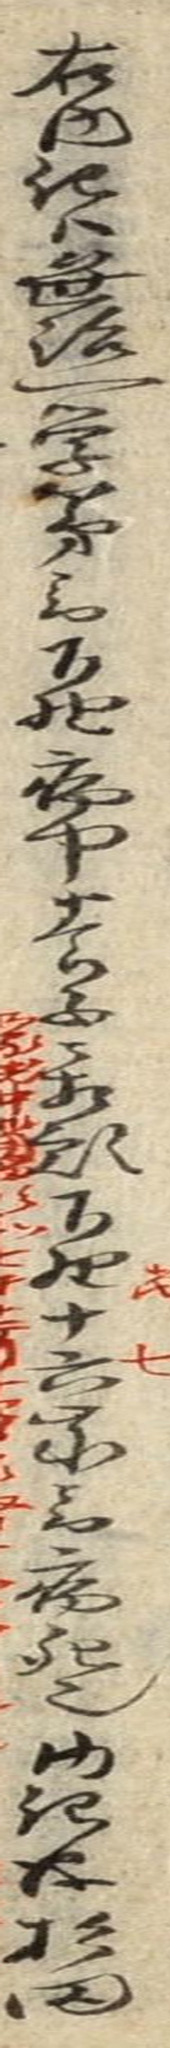右内記は笹治一学弟に而下野病中養子に相願下野十六歳に而病死也内記儀杉田
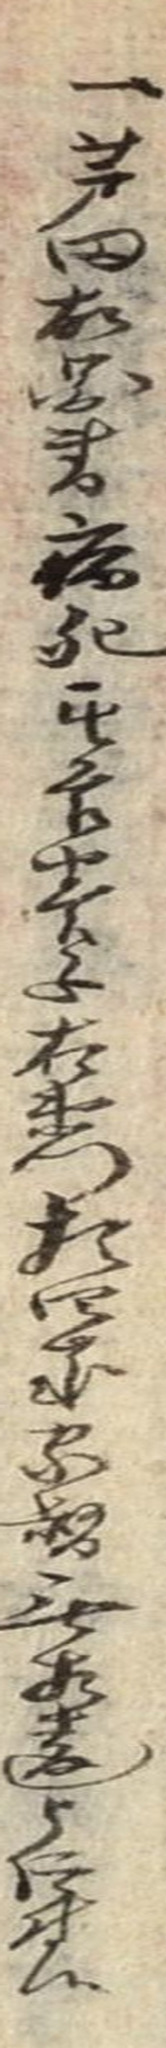一芦田故図書病死其節養子右衛門拾四歳家督無相違被仰付候
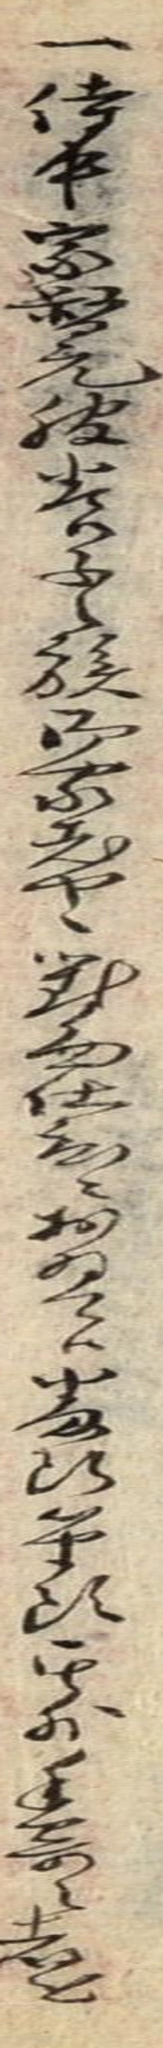一侍中家督元服養子之族御家老中へ対面仕度におゐては番頭筆頭其外手寄之者を
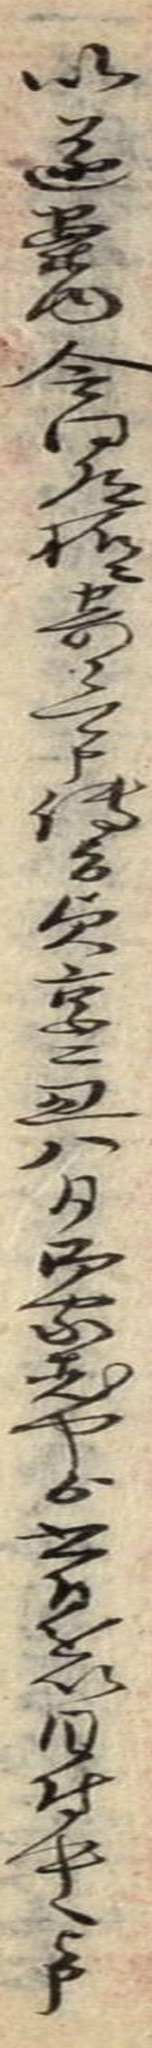以遂案内令同道候様に寄々可申伝旨貞享二丑八月御家老中ゟ書付を以目付中へ被申
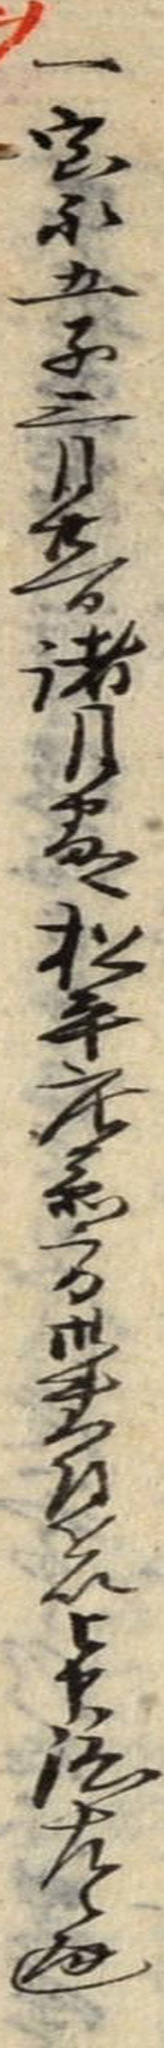一宝永五子三月廿一日諸月番へ松平庄兵衛方御書付を以被申渡左之通

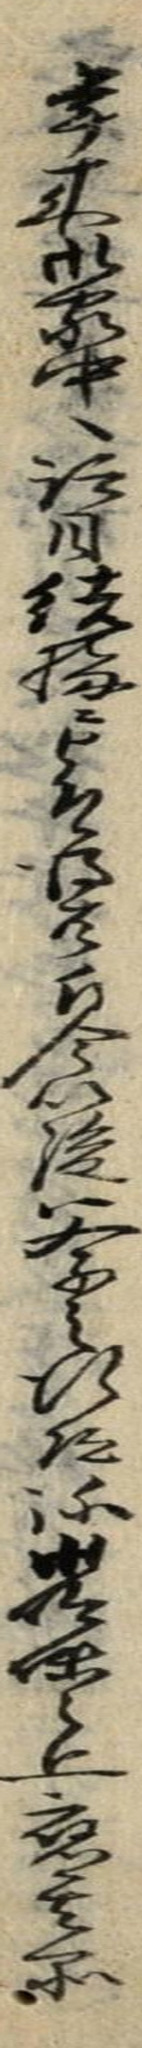年来御家中へ跡目結構に被下候得共自今以後父子之行跡弥御吟味候上応其品
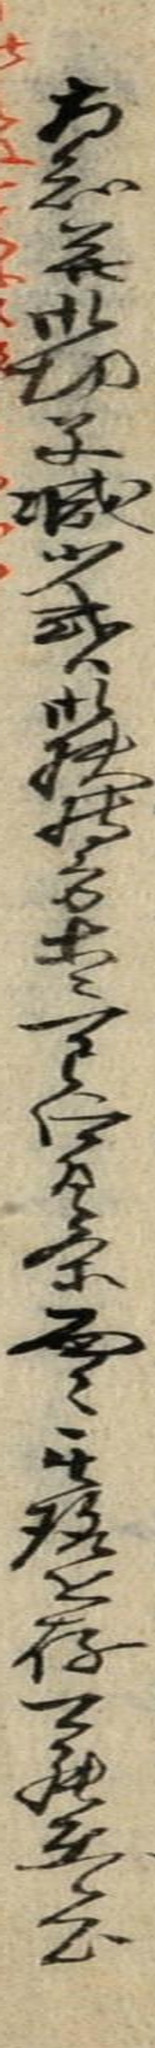拝知并御切米減少或は御扶持方等に可被仰付候条面々其趣を存可罷在候以上
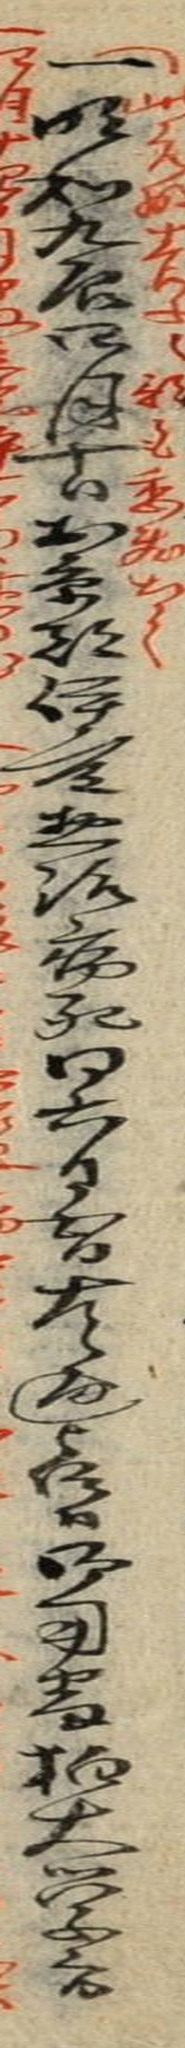一明和九辰四月十日於京都伊藤惣治病死同六月五日左之通被仰付御用番狛大学方
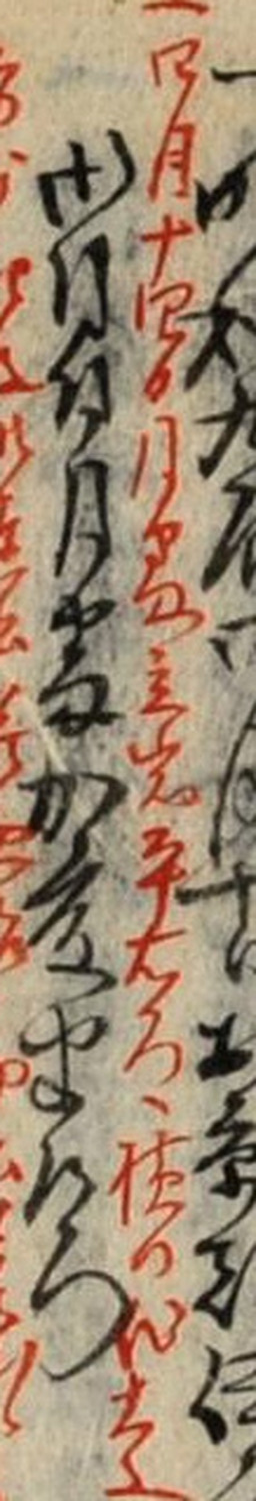御目付月番加藤半左衛門
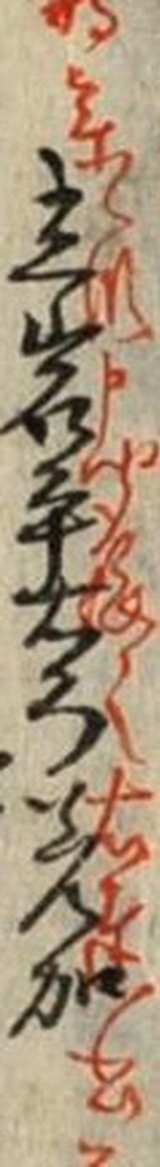立岩平右衛門差加
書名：御用并被仰出之部
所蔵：福井県文書館 Fukui Prefectural Archives
